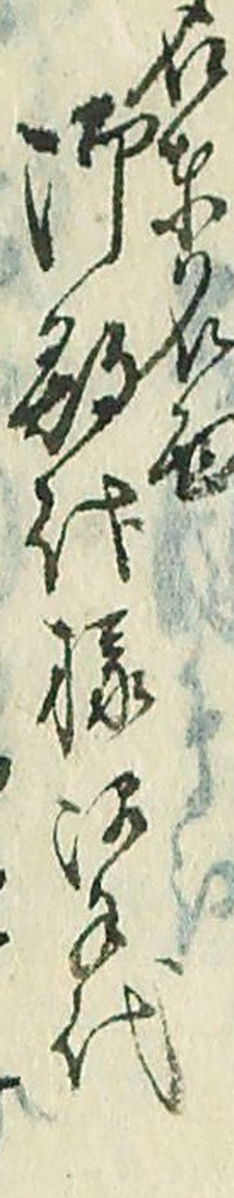御郡代様御手代
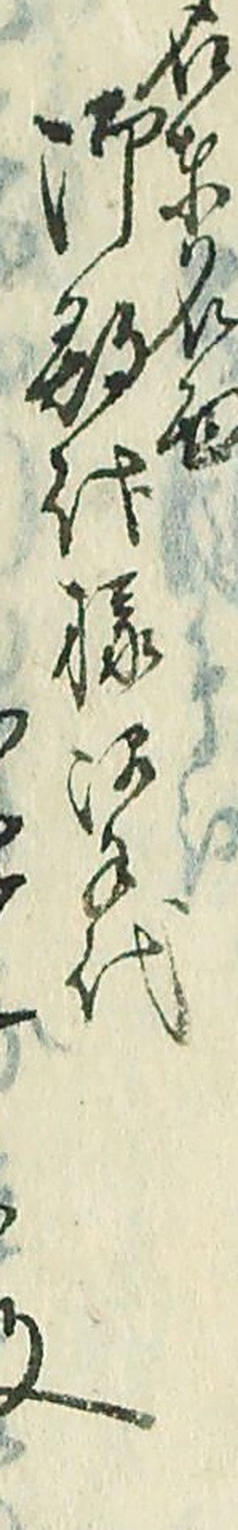御郡代様御手代
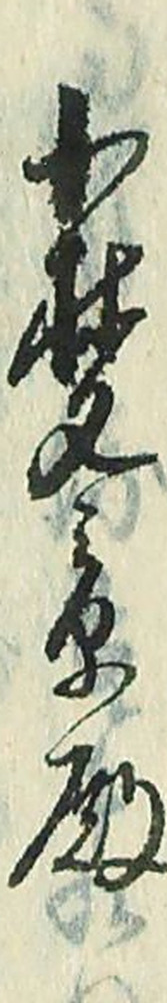小林又兵衛殿
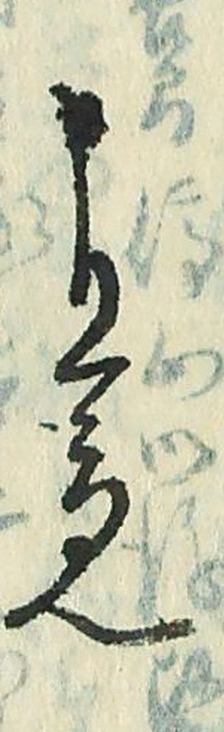申上覚
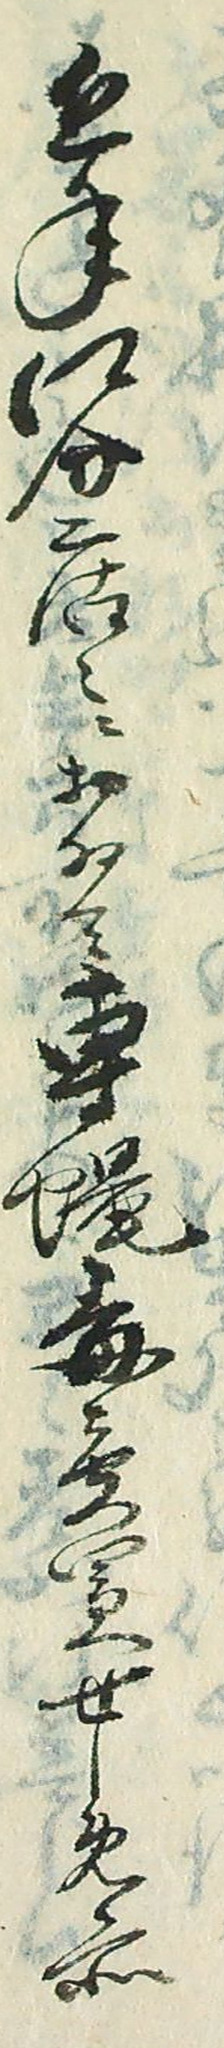近年郷分店々におゐて専蠅毒売買せしめ候所
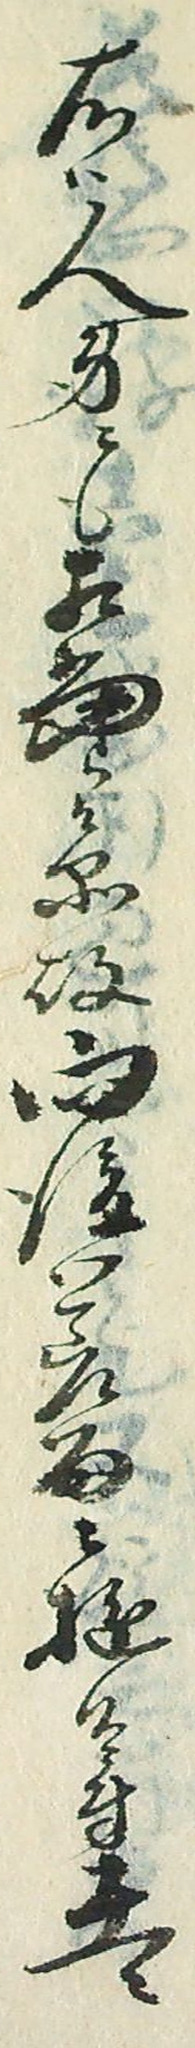右は人身にも相当り候品故向後差留被遊候に付在々
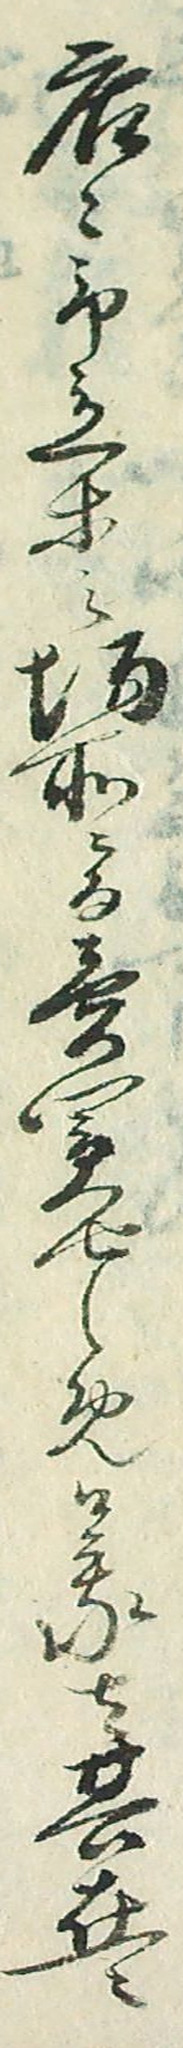店々市立等之場所に而売買せしめ候義は其在々
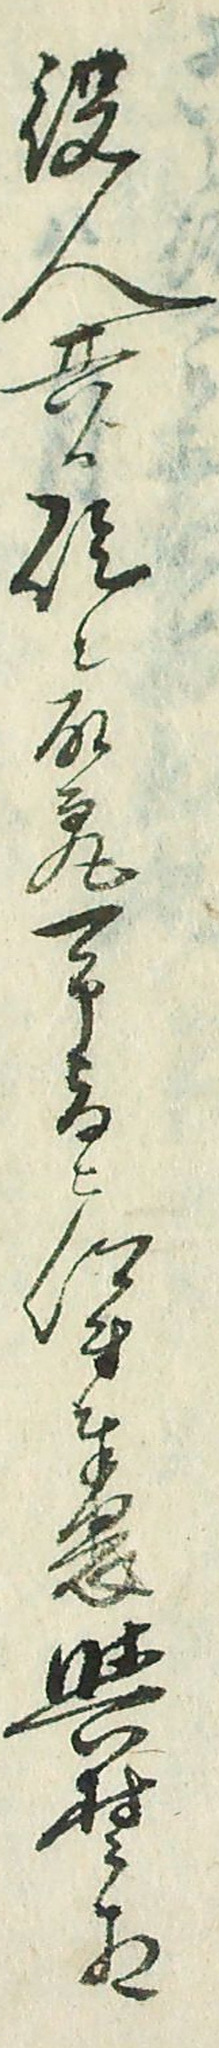役人共ゟ屹と取究可申旨被仰付奉畏与村々相
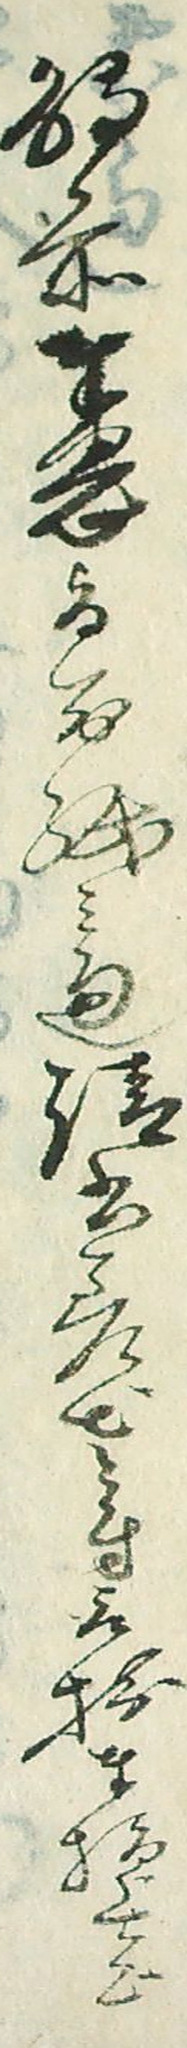触候所奉畏旨別紙之通請書差出に付取揃奉指上候以上
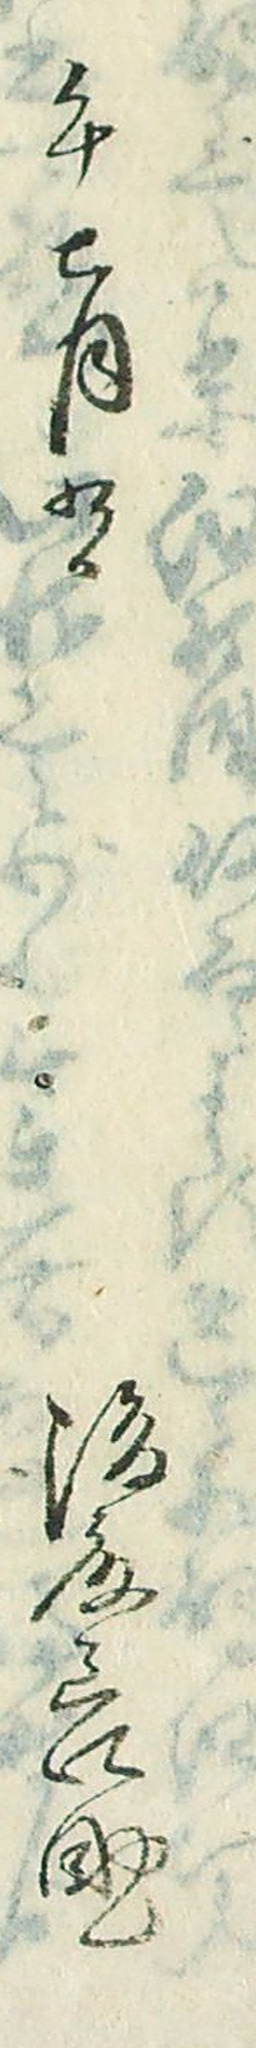午七月九日後藤善助
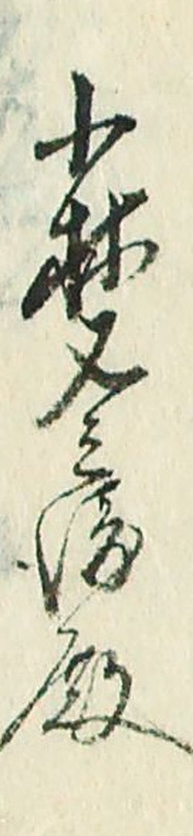小林又兵衛殿

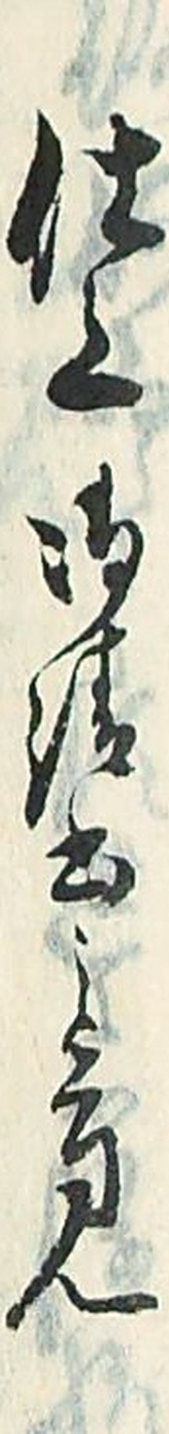仕上御請書之覚
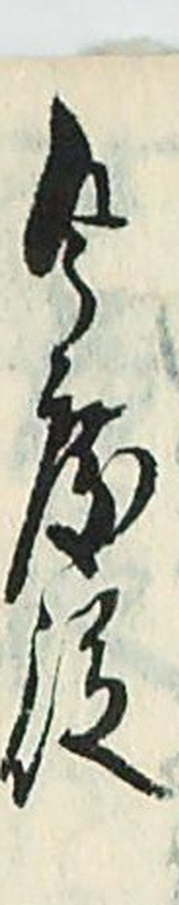今度従
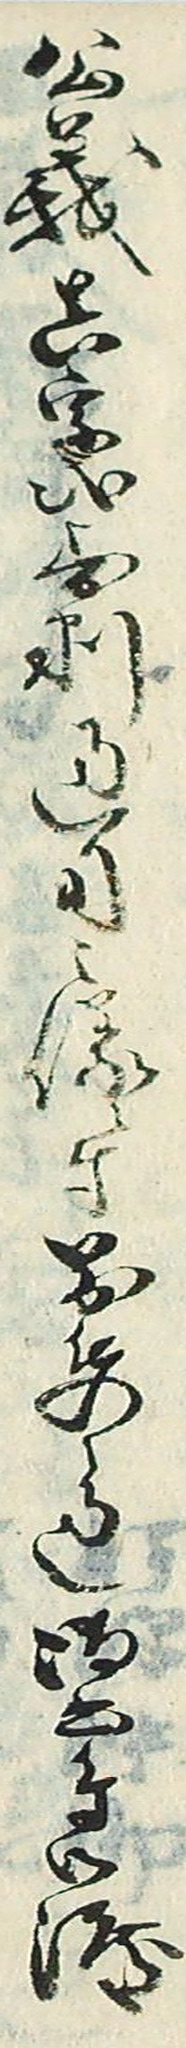公義真字弐歩判通用之儀に付別帋之通御書付御渡
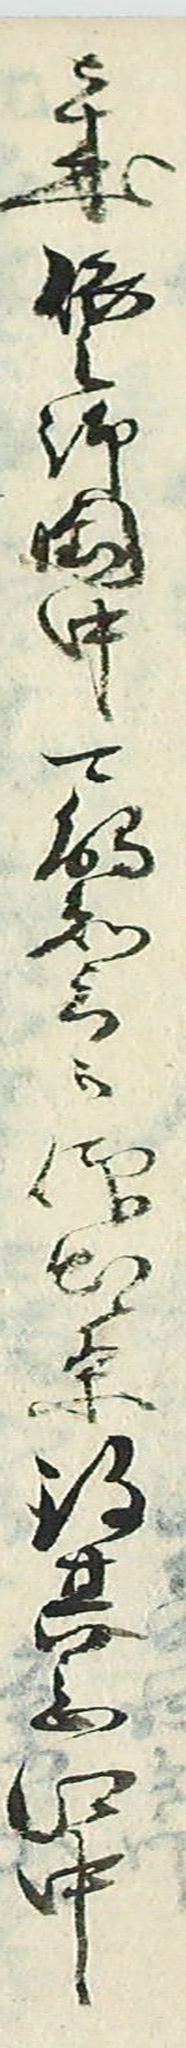被成依之御国中可触知旨被仰出候条得其意郷中
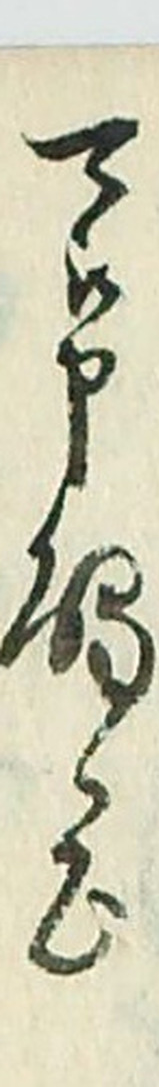可被申触候以上
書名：諸御用御□受書控
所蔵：鳴門教育大学 Naruto University of Education
